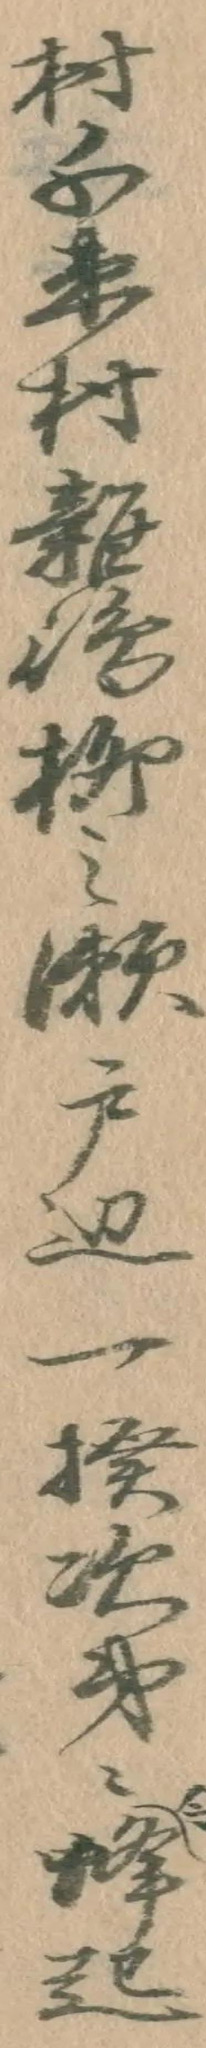村千束村離島柳之瀬戸辺一揆次第に令蜂起
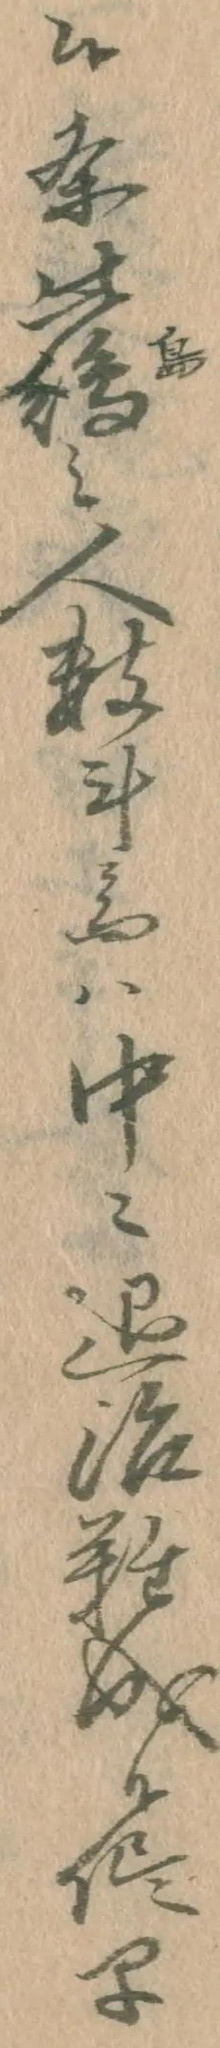候条此島之人数斗に而は中々退治難成候侭早
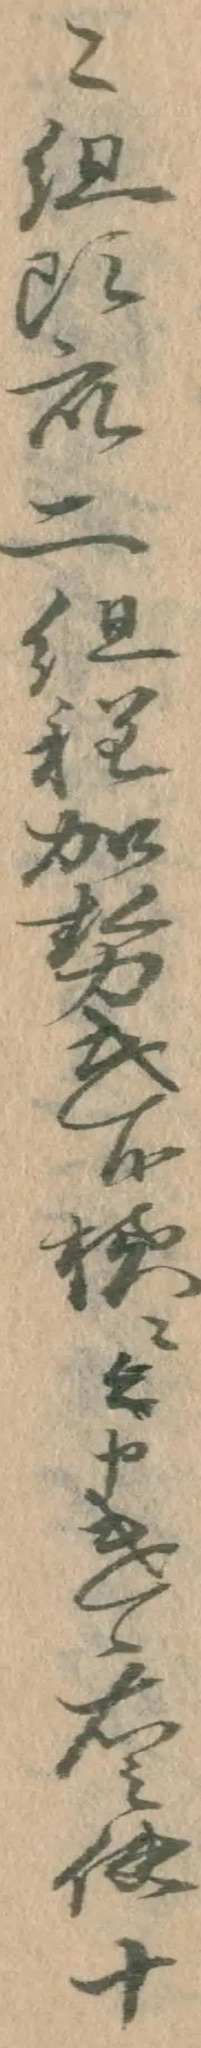々組頭衆二組程加勢遣候様に遣与申遣右之使十
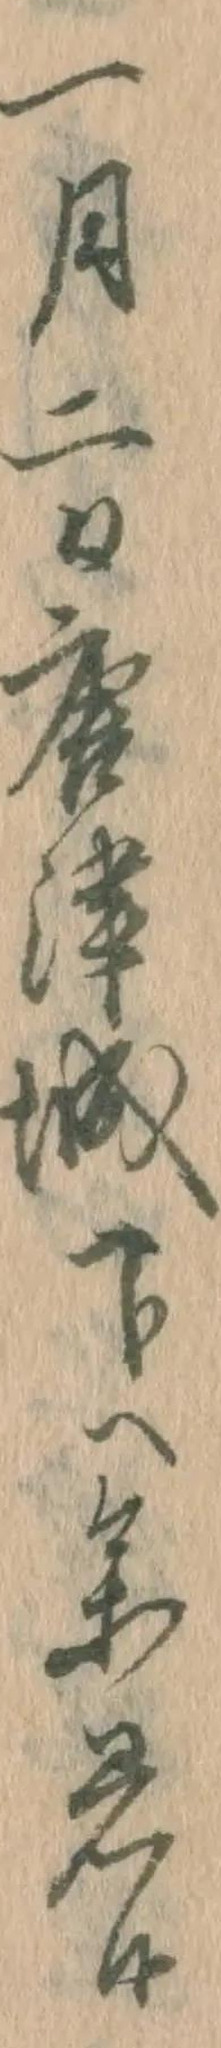一月二日唐津城下へ参着候
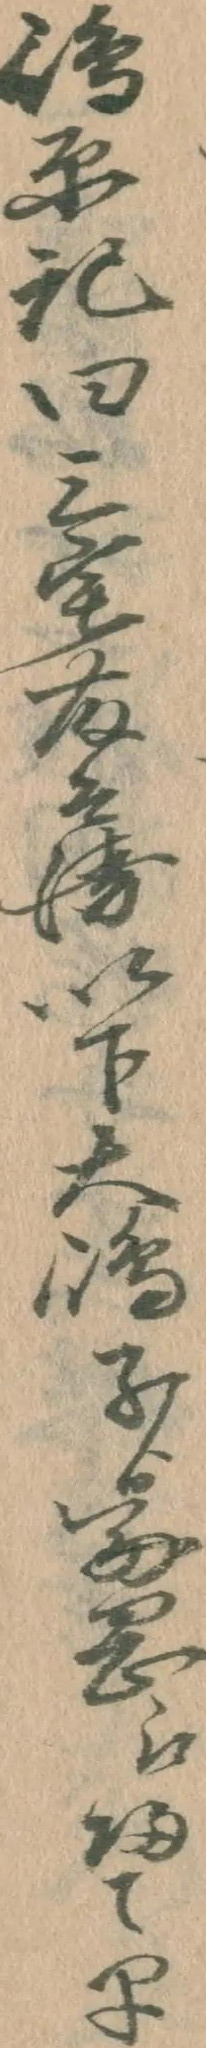島原記曰三宅藤兵衛以下大島子ゟ冨岡江帰て早
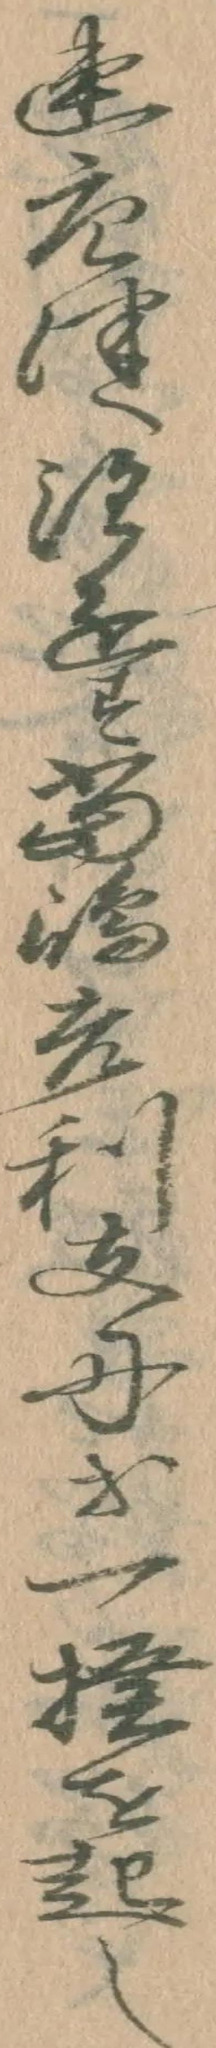速唐津へ注進春当島吉利支丹等一揆を起し
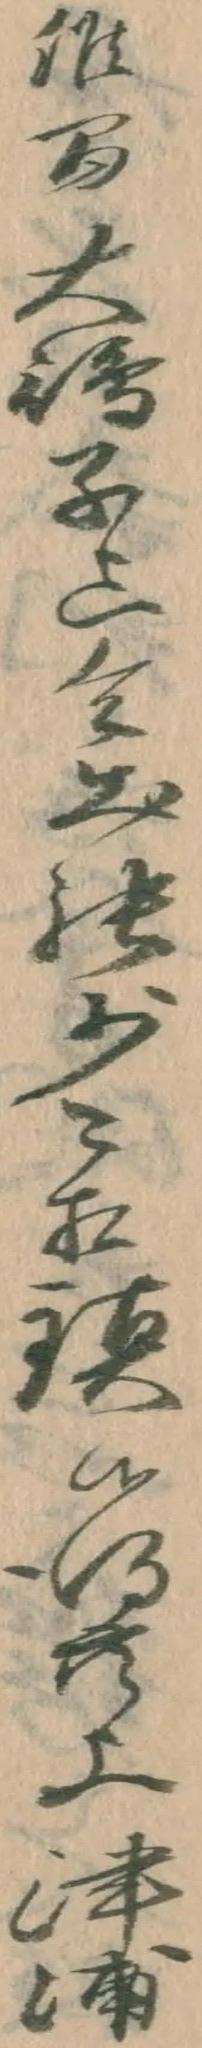候間大島子迄令出張少々相鎮候得共上津浦
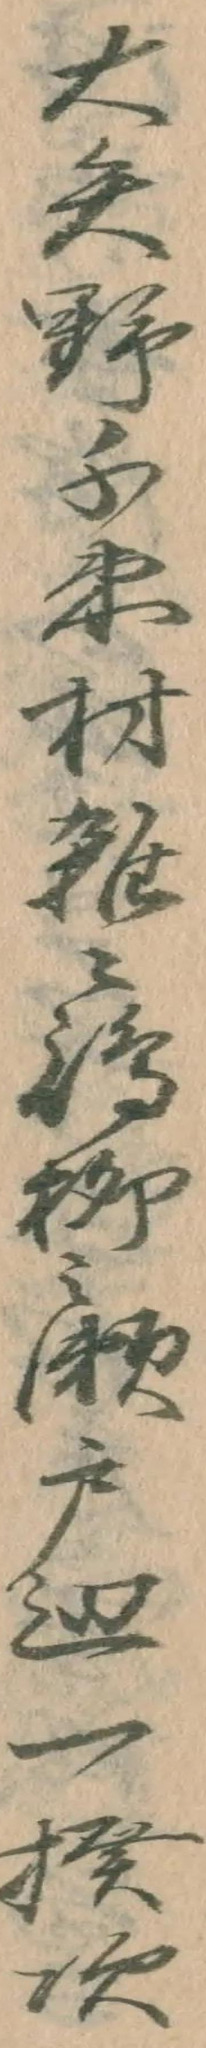大矢野千束村雑に嶋柳之瀬戸辺一揆次
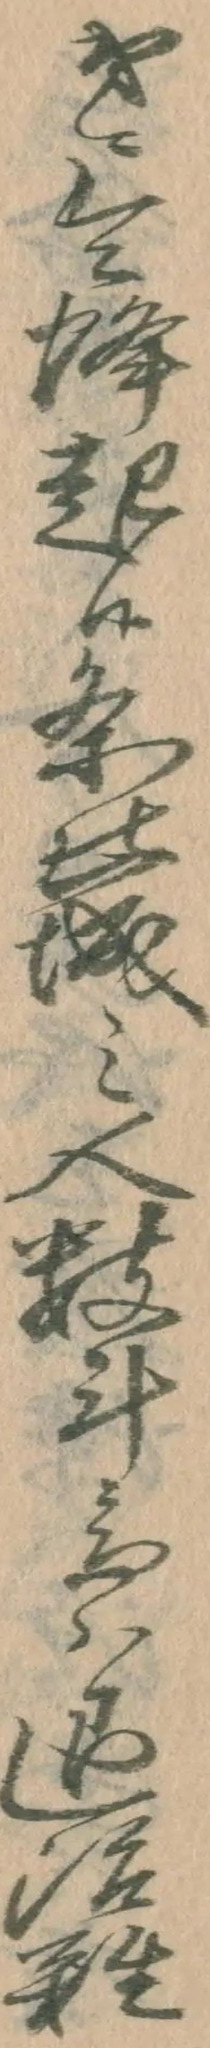第に令蜂起候条此城之人数斗に而は退治難
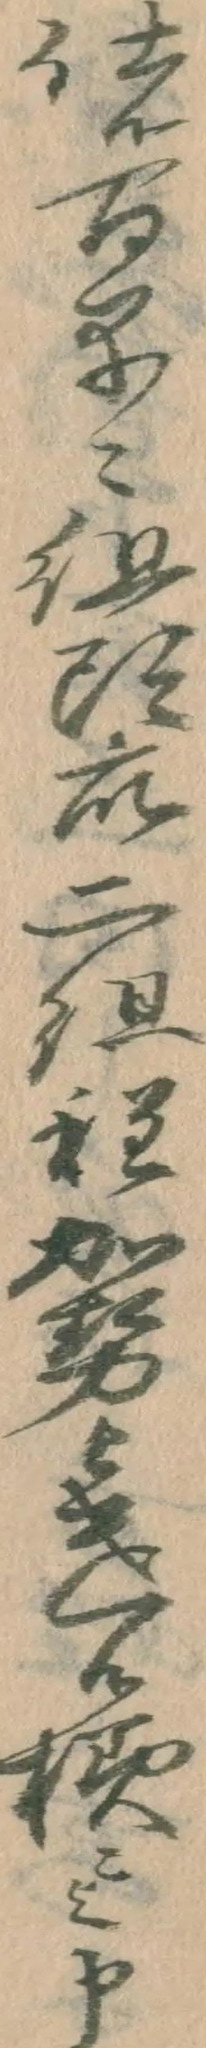仕候間早々組頭衆二組程加勢被遣候様に与申
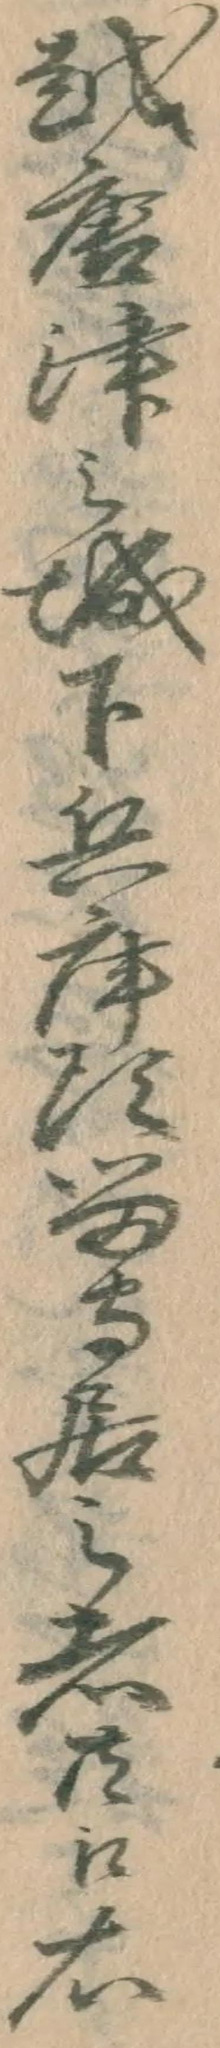越唐津之城下兵庫頭留守居之者共江右
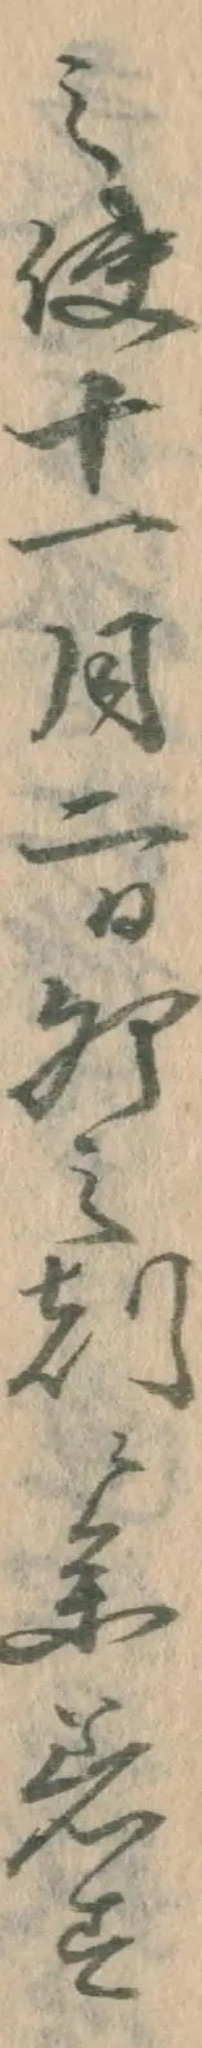之使十一月二日夘之刻に参着春
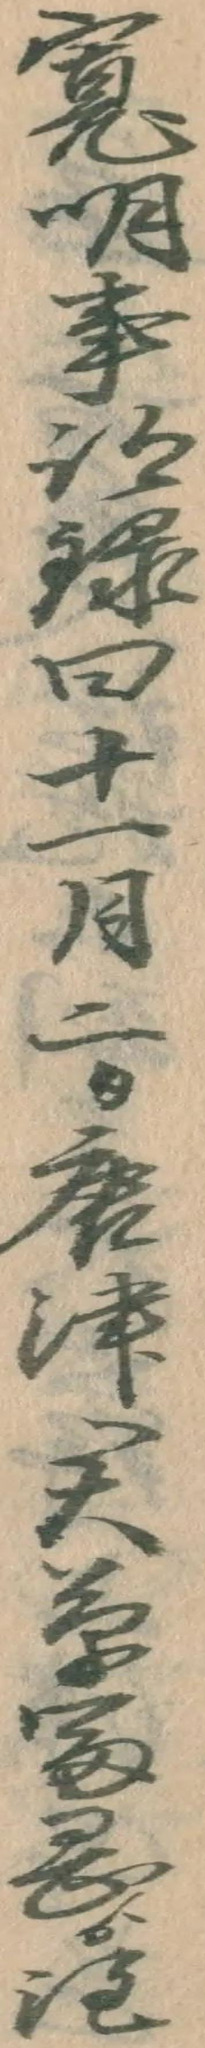寛明事跡録曰十一月二日唐津へ天草富岡ゟ注
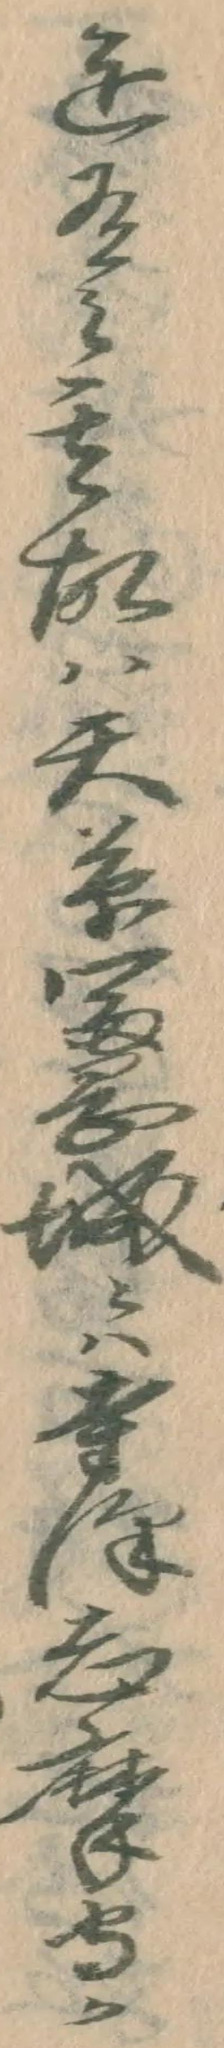進有之其故は天草冨岡城には寺沢志摩守に

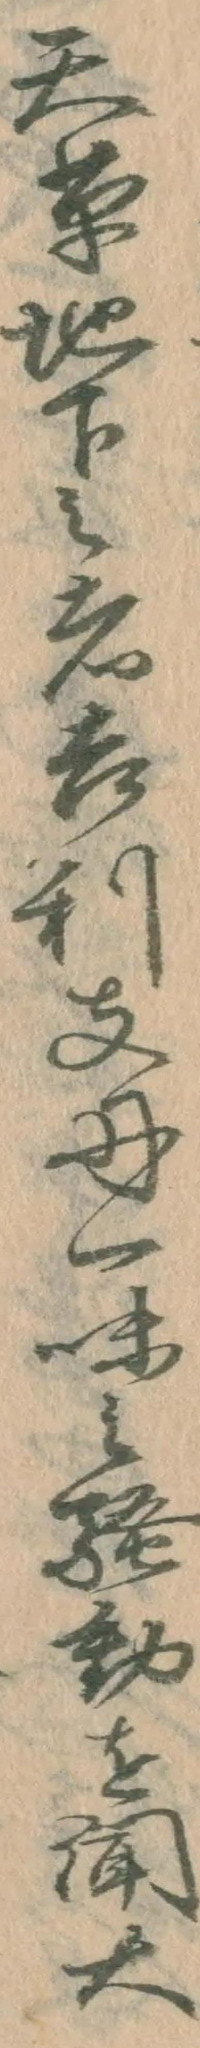天草地下之者吉利支丹一味之騒動を聞大
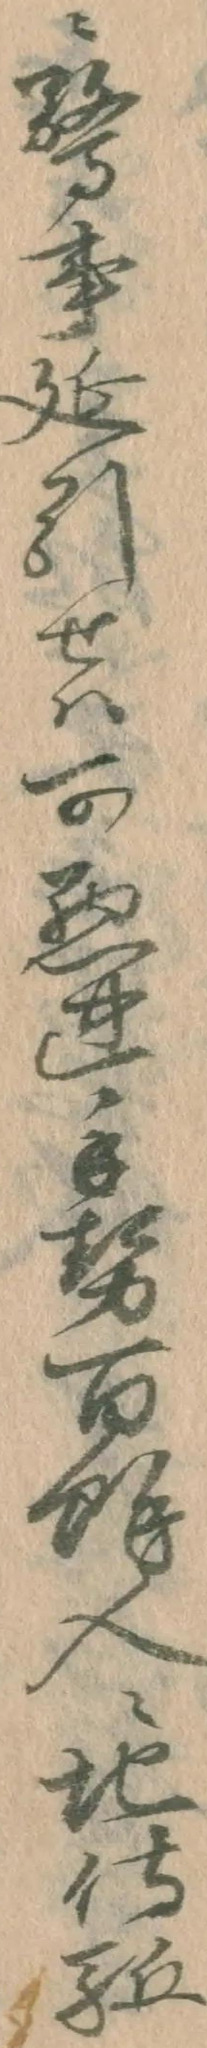に驚事延引せは可悪迚手勢百余人に地侍馳
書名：切支丹御退治記 49巻. [2]
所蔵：国立国会図書館 National Diet Library, JAPAN
